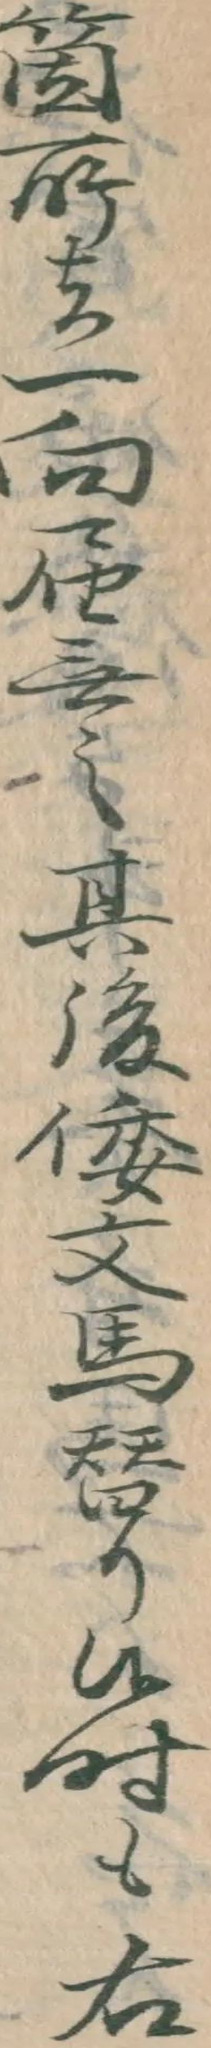箇所者一向届無之其後倭文馬替り候時も右
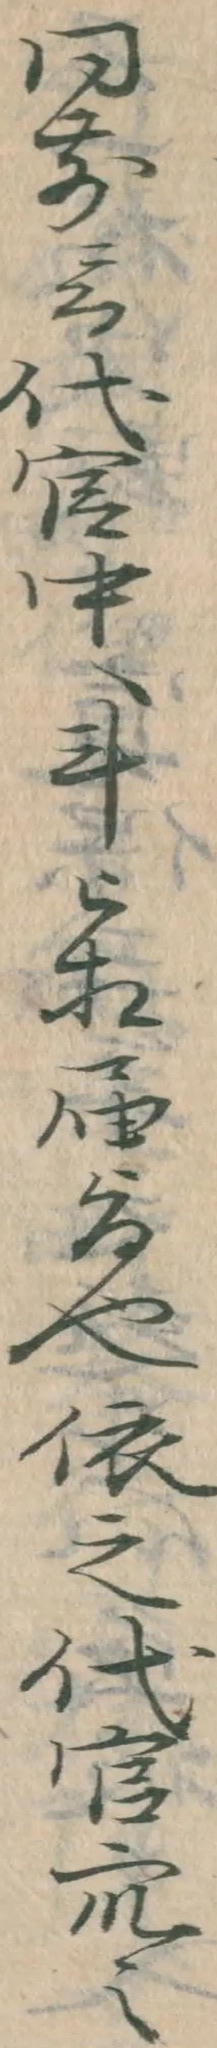同前ニ而代官中へ計被相届旨也依之代官衆之
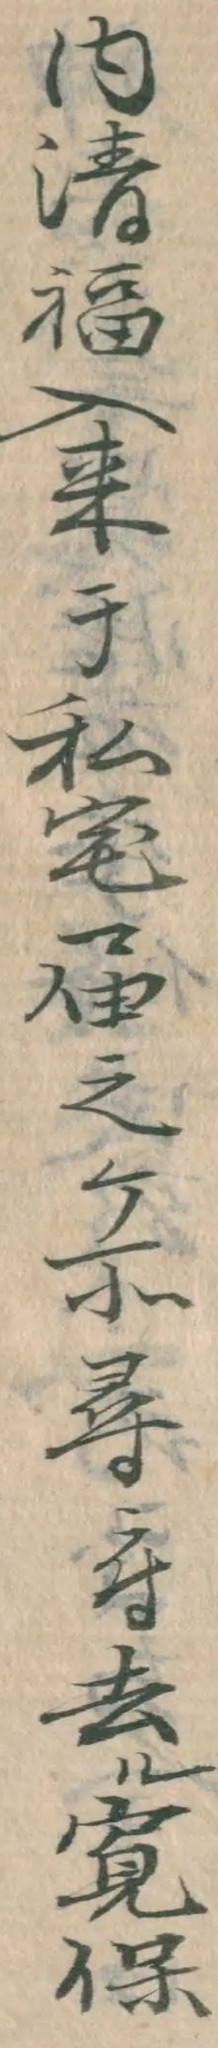内清福入来于私宅届之ケ所尋ニ付去ル寛保
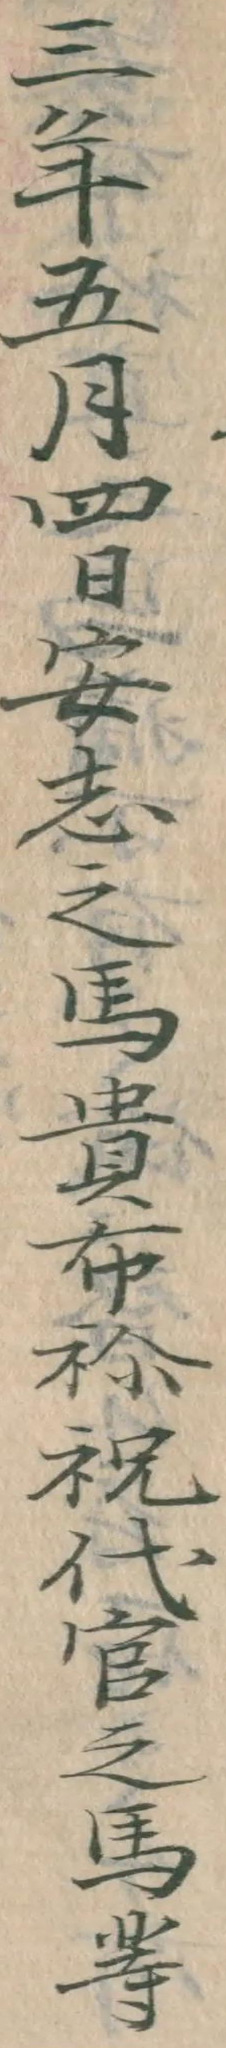三年五月四日安志之馬貴布祢祝代官之馬等
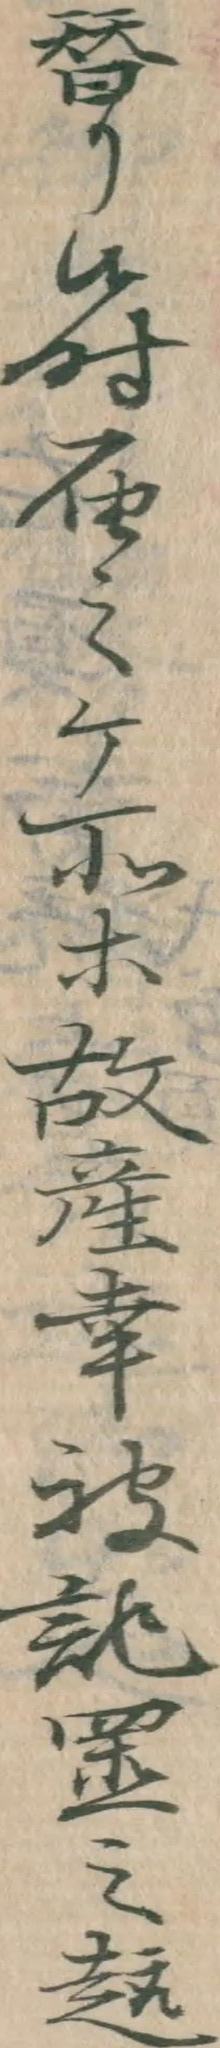替り候時届之ヶ所等故産幸被記置之趣
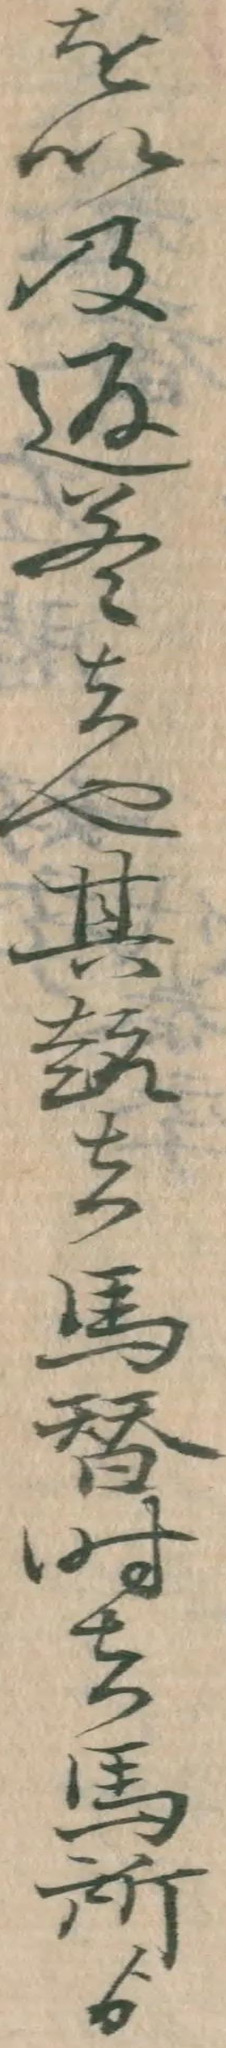を以及返答者也其趣者馬替時者馬所ゟ
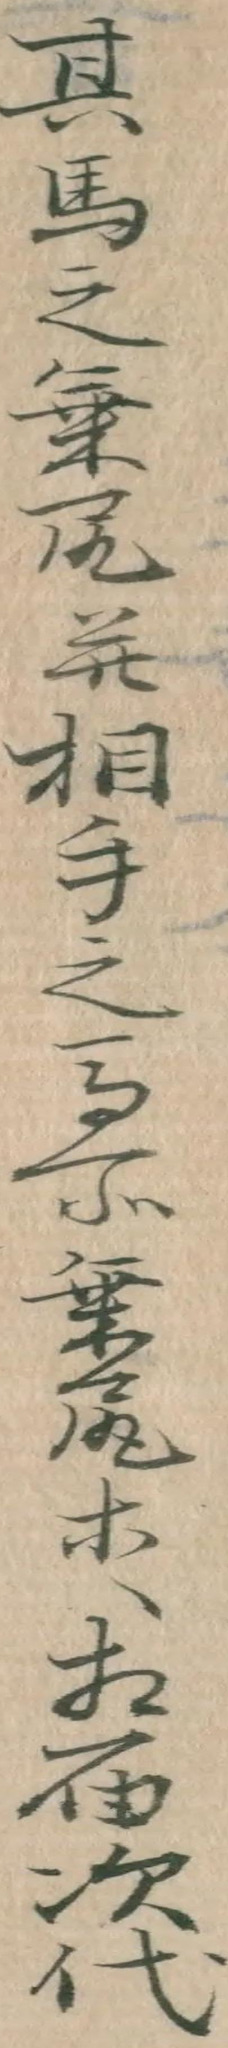其馬之乗尻并相手之馬所乗尻等へ相届次代
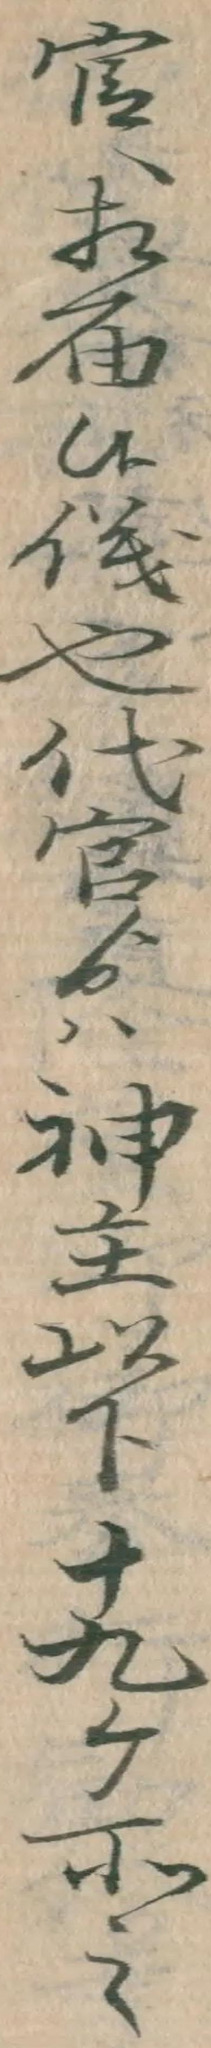官へ相届候儀也代官ゟハ神主以下十九ヶ所之
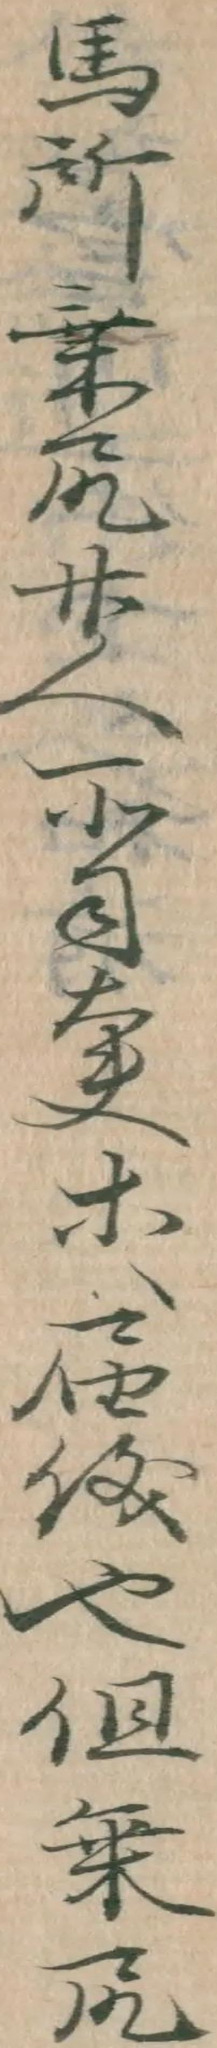馬所乗尻廿人所司大夫等へ届儀也但乗尻
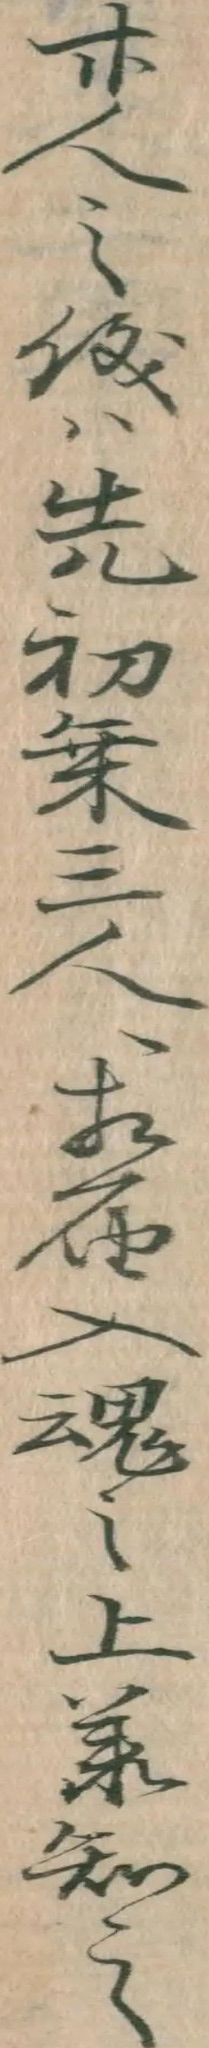廿人之儀ハ先初乗三人へ相届入魂之上承知之
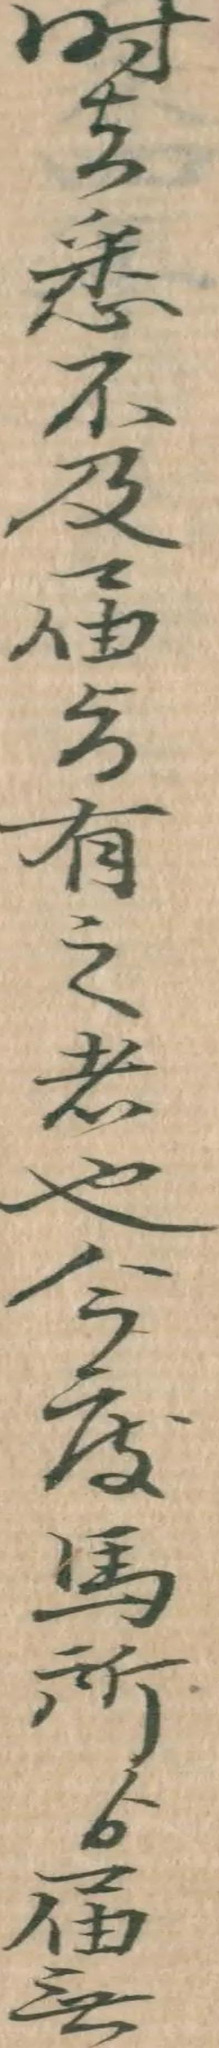時者悉不及届旨有之者也今度馬所ゟ届無
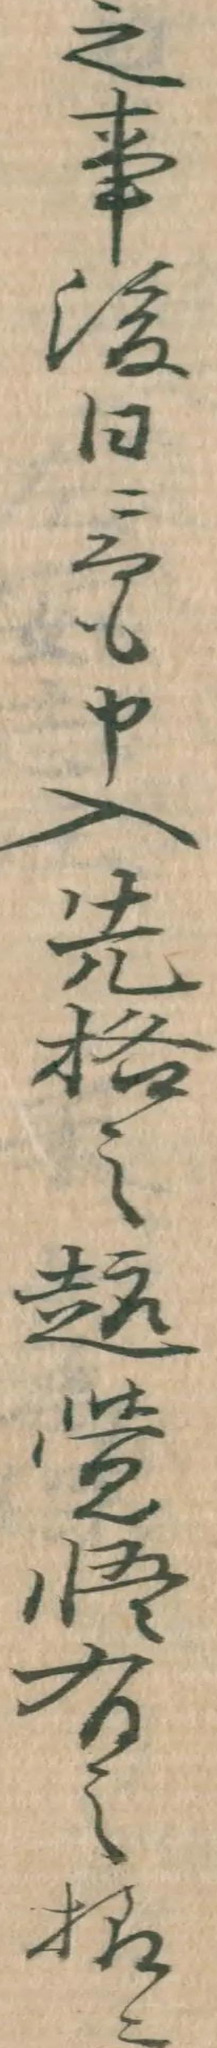之事後日ニ而も申入先格之趣覚悟有之様ニ
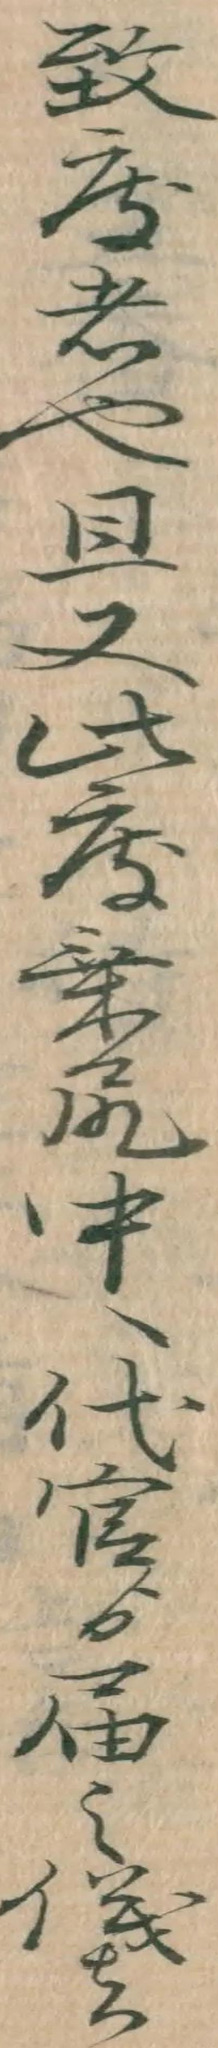致度者也且又此度乗尻中へ代官ゟ届之儀者
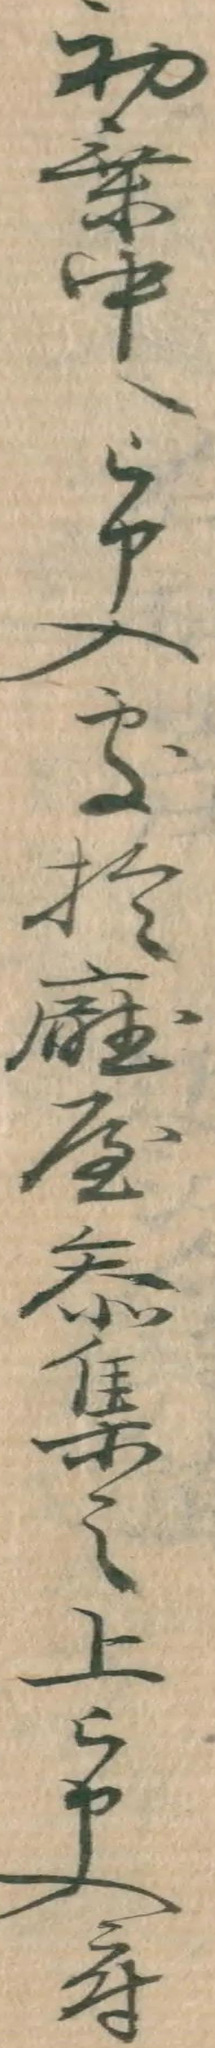初乗中へ被申入処於庁屋参集之上被申入ニ付
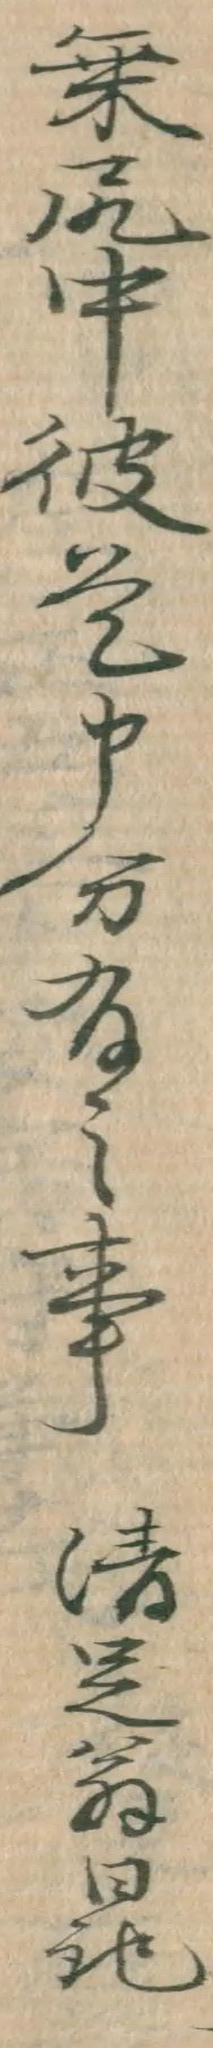乗尻中彼是申分有之事清足翁日記

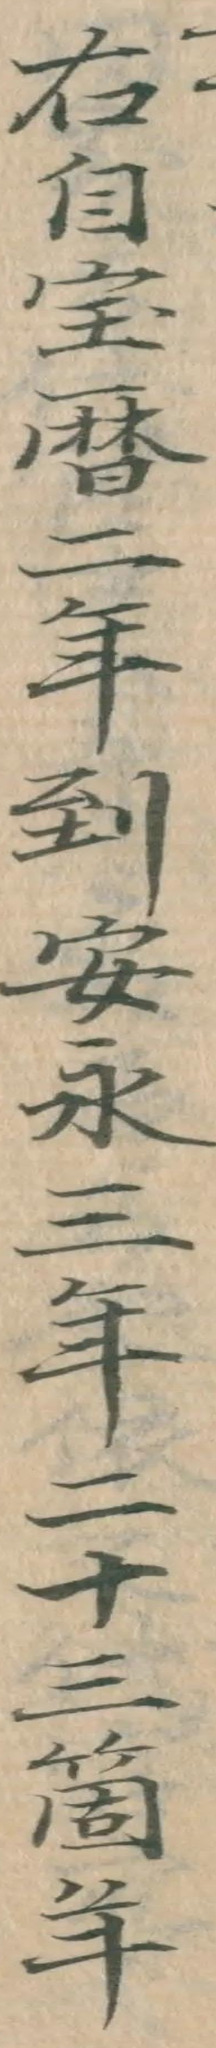右自宝暦二年到安永三年二十三箇年
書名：賀茂社記録. 第10冊
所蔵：国立国会図書館 National Diet Library, JAPAN
